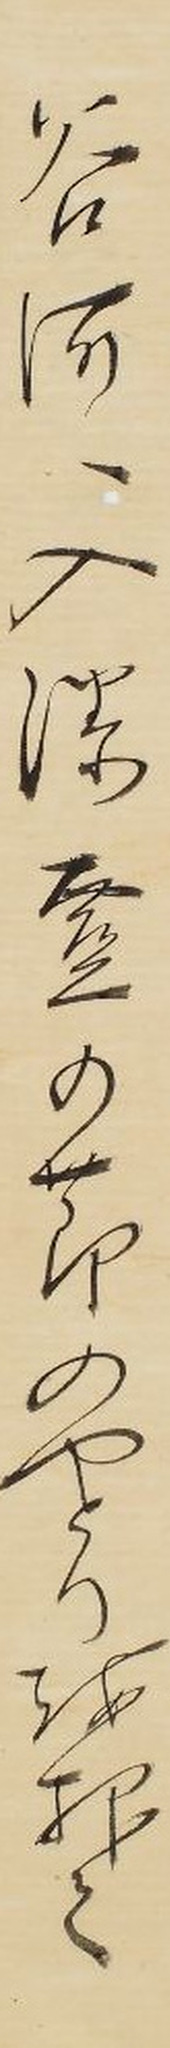谷河へ入湊登の節のやとりを報て
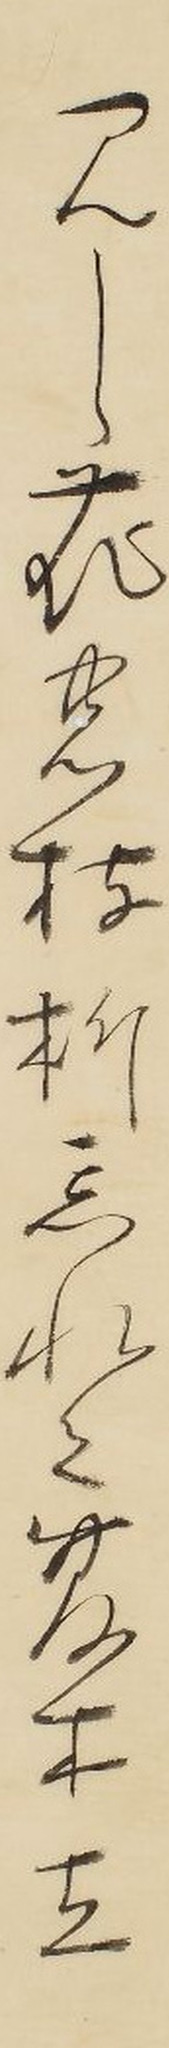見し花の枝折忘れて夏木立
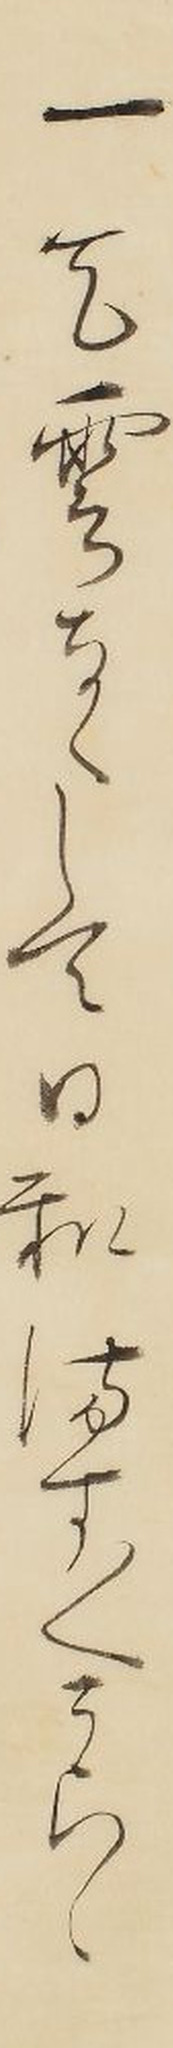一天雲なくして日和ます〳〵うらゝ
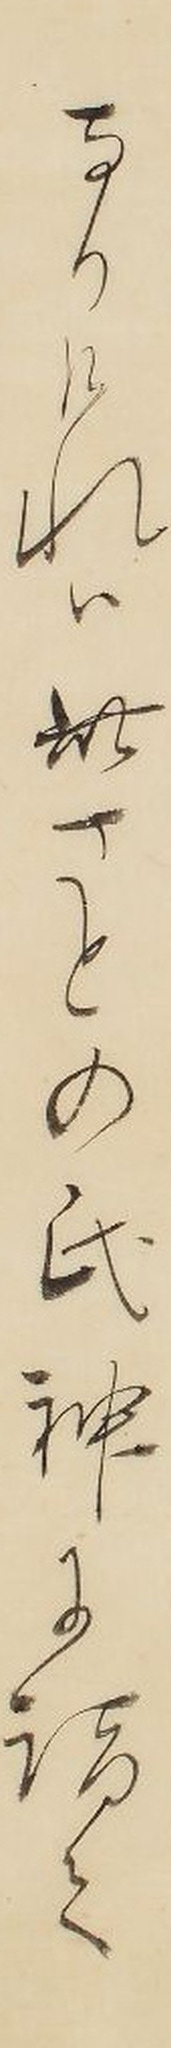なりけれは此さとの氏神に詣て
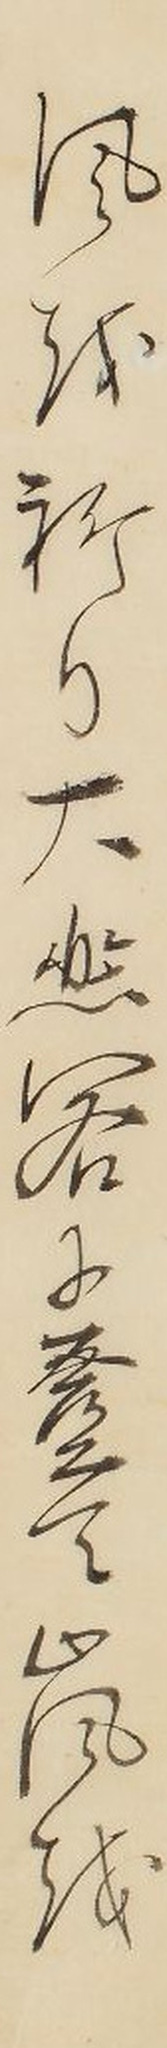風を祈り大悲閣に登て嵐を
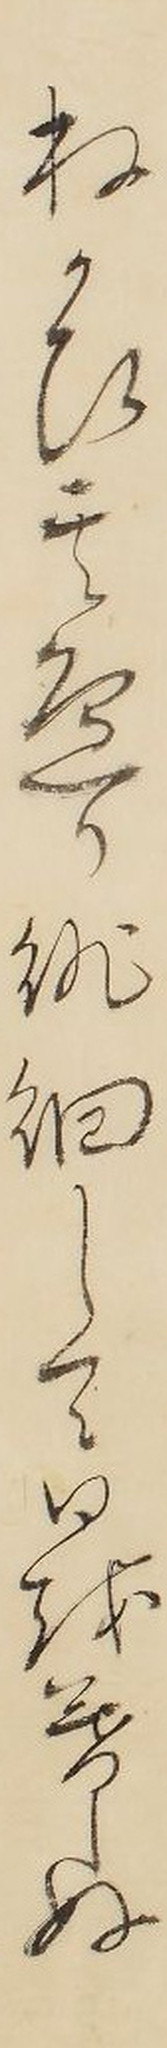ねかひ其辺り徘徊して日を暮しぬ
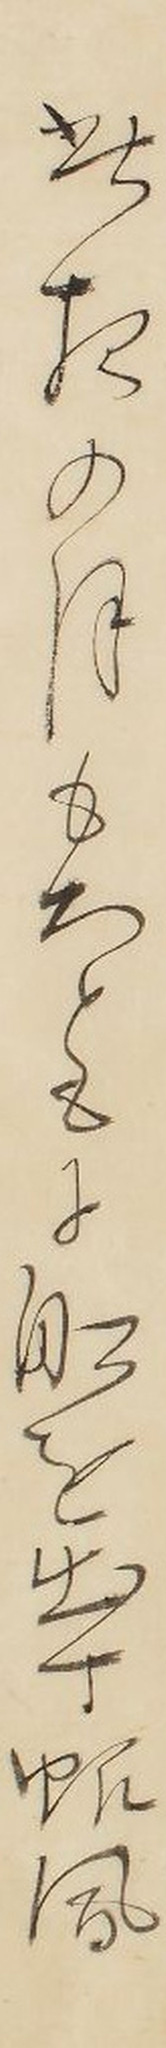此夜の月もろともに船を出す帆風
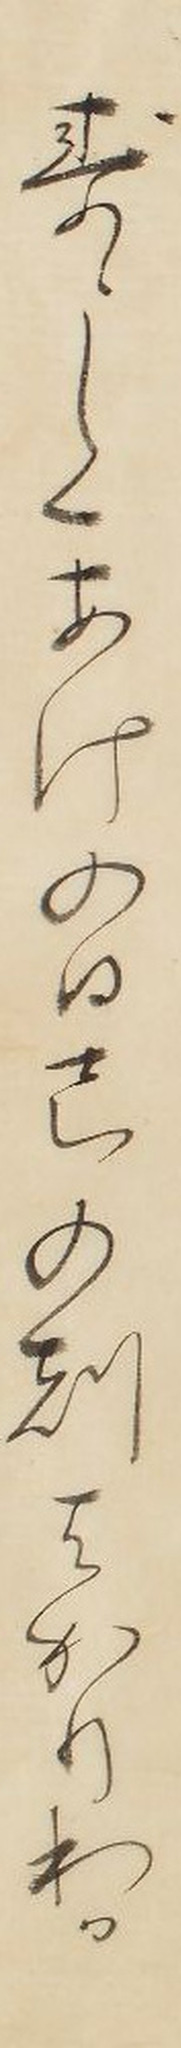すゝしくあけの日巳の刻はかりわか
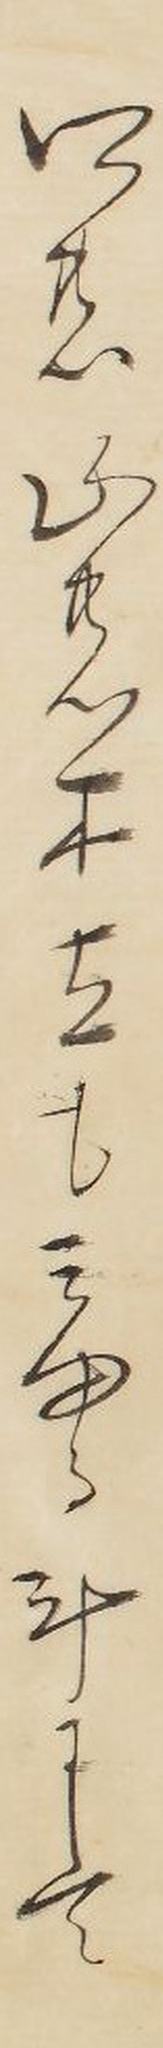郷の山の木立もみゆる計にして
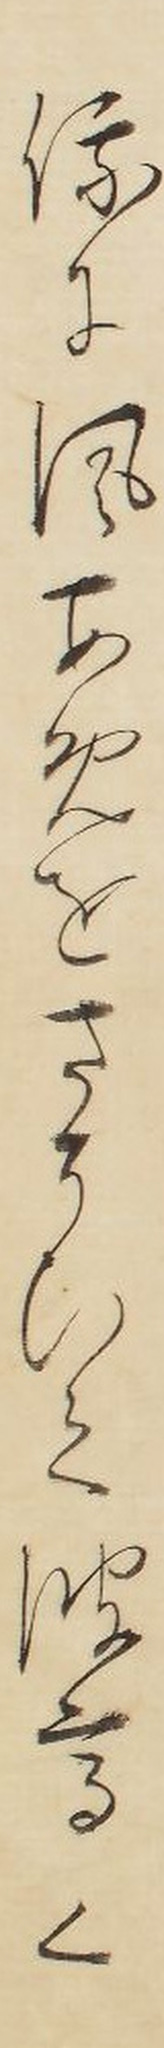俄に風あめをさそひて波高く

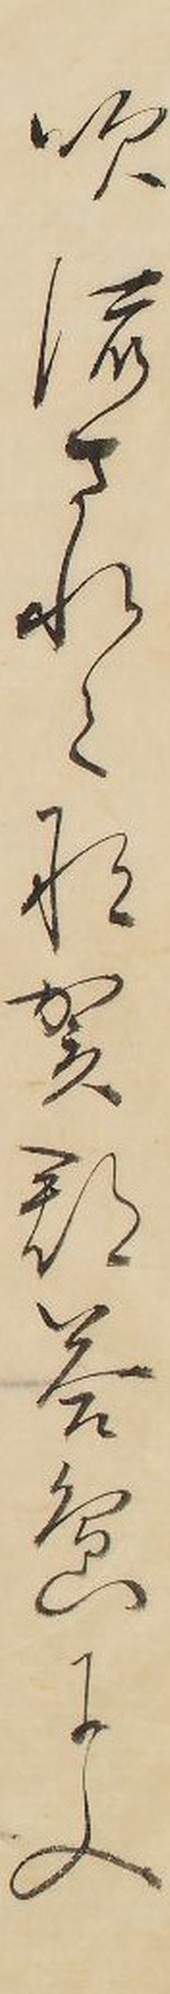吹流されて那賀郡答島に入
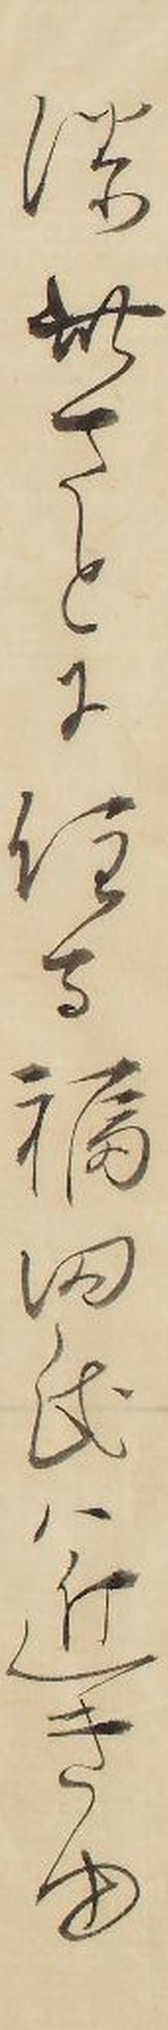湊此さとに住る福田氏は近きゆ
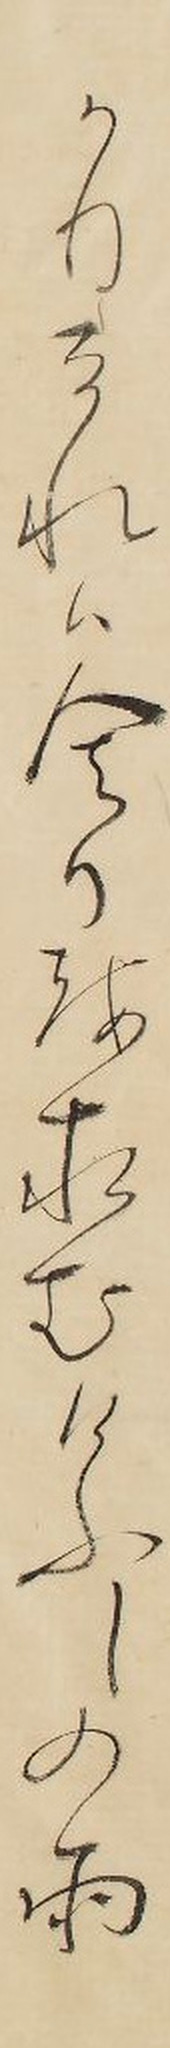かりなれは舎りを求むけふしの雨
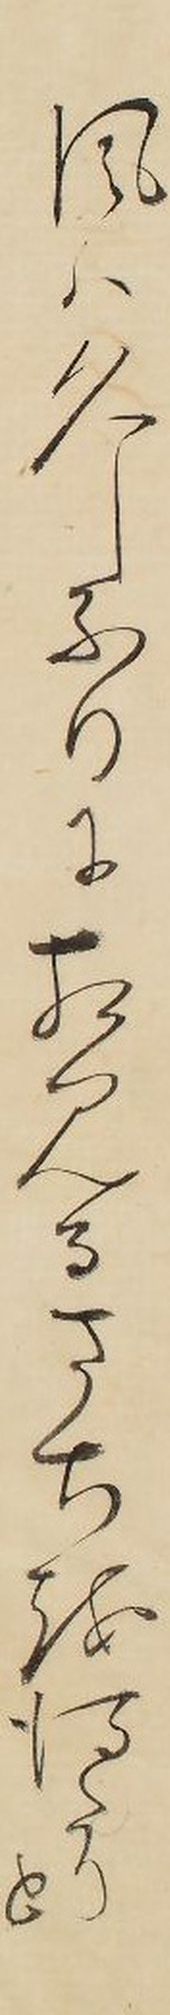風は久しふりに相見るさちを得たりと
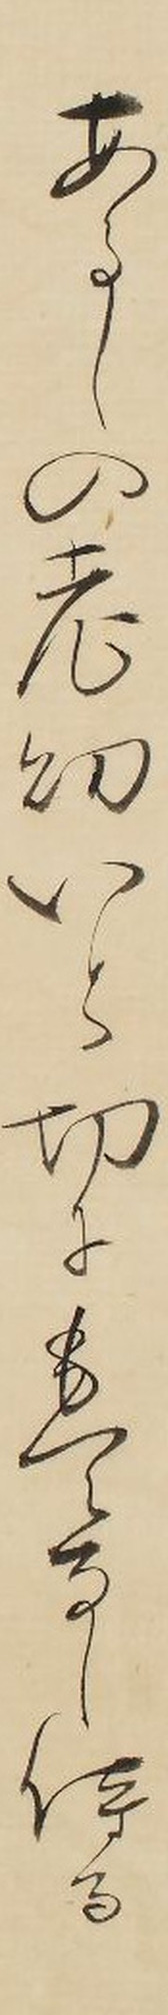あるしの老幼いと切にもてなし侍る
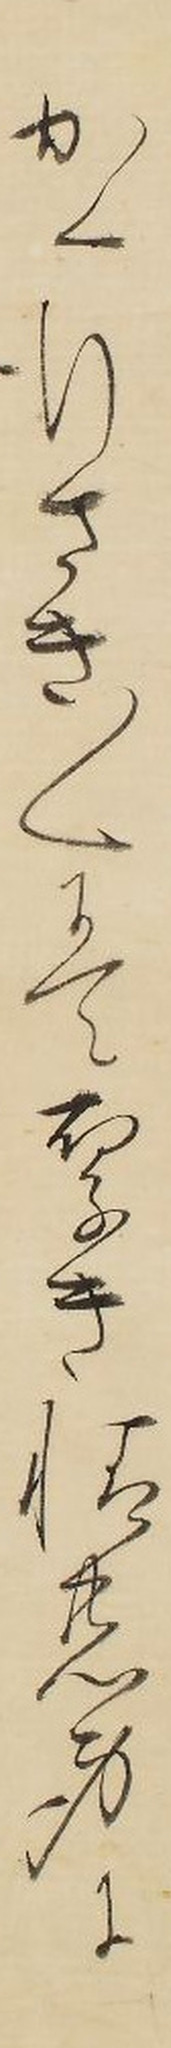かく行さき〳〵にて厚き情の身に
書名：花土産
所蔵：徳島県立図書館
